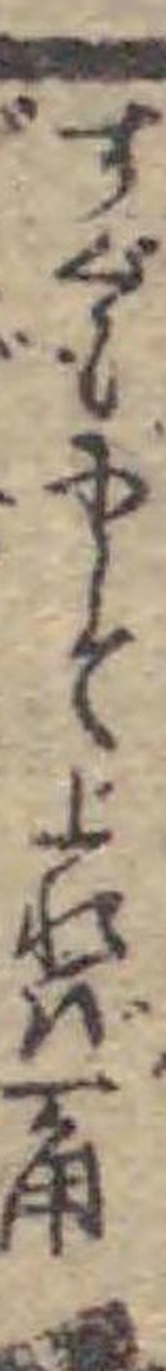すぐもにして上れば一角
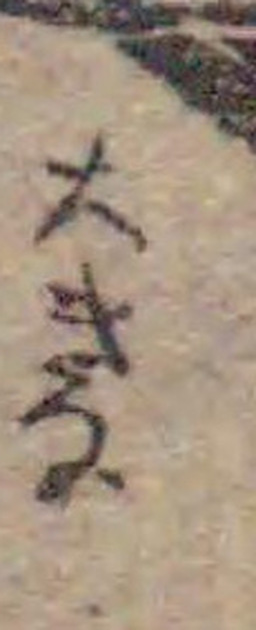大きな
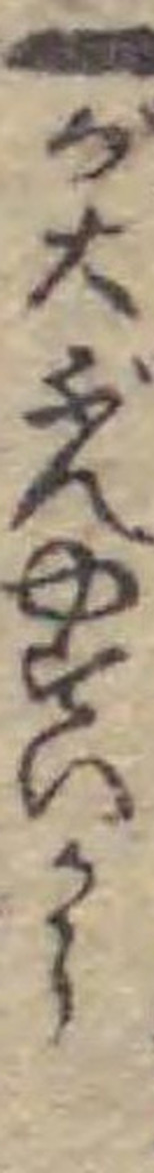が大ぶんやすいから
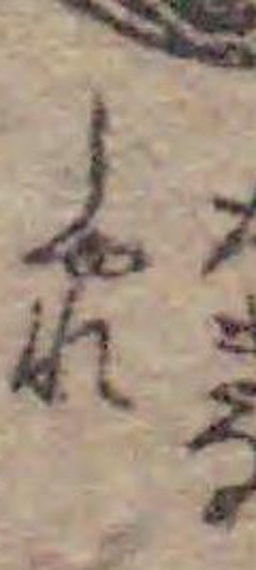しやれ
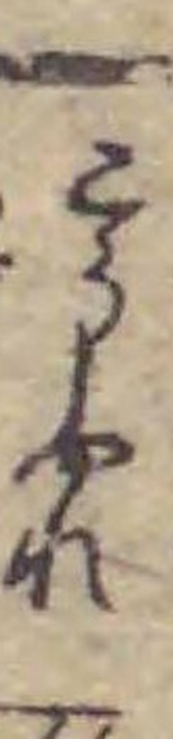こうしやれ
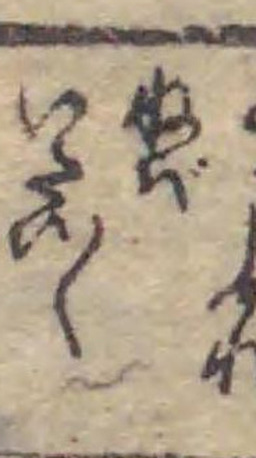いたい〳〵
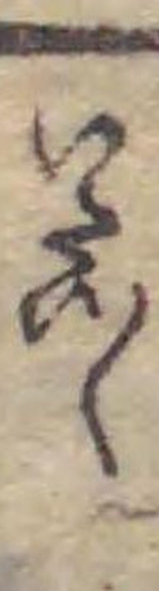いたい〳〵

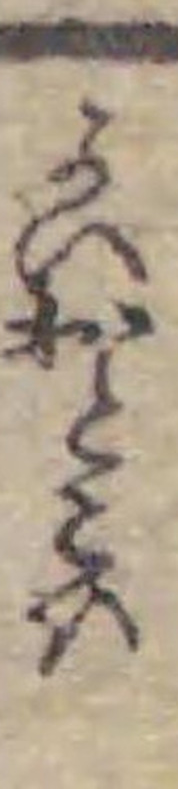よいおとこは
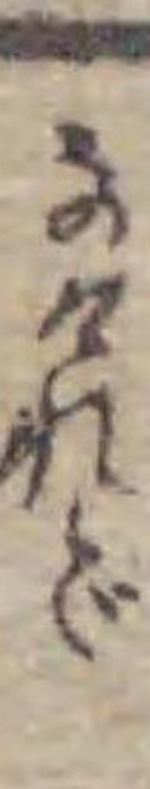なけれど
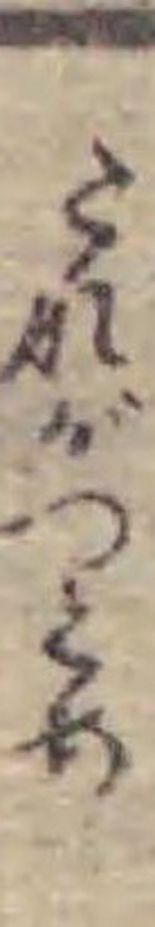これがつとめ
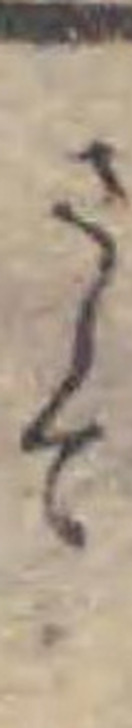さして
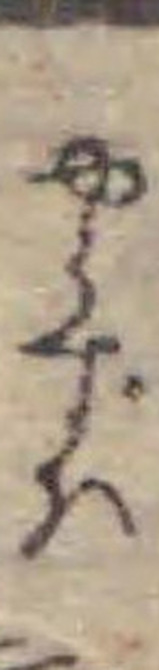やらずは
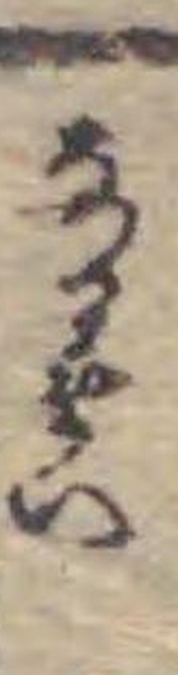なるまい
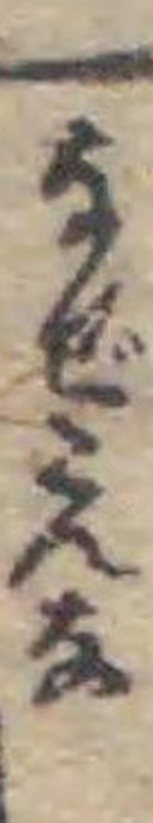なぜこんな
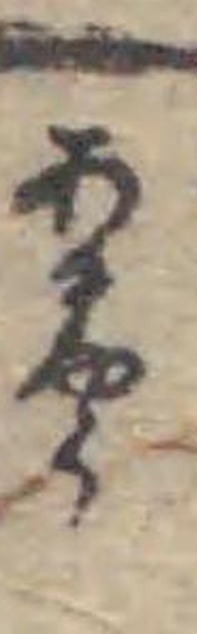あるやら
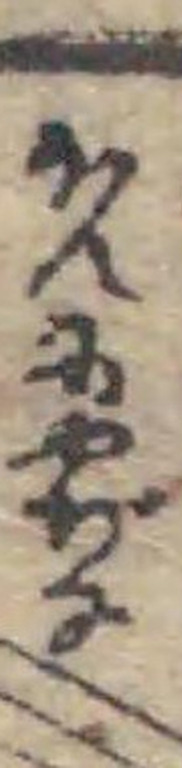ほんにやぼな
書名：威気千代牟物語 : 2巻
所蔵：国立国会図書館 National Diet Library, JAPAN
